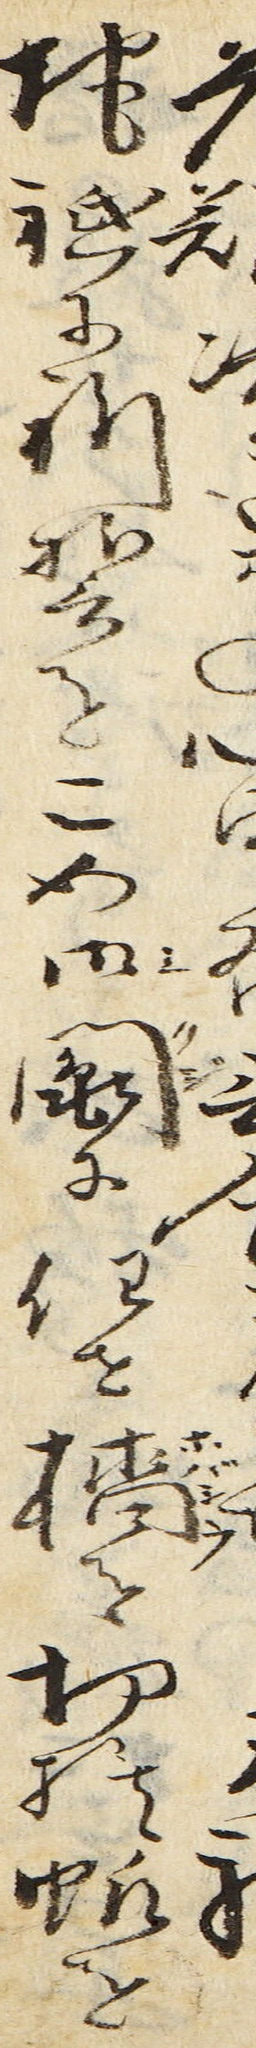地祇に祈誓をこめ御鬮に任せ檣を切捨帆を
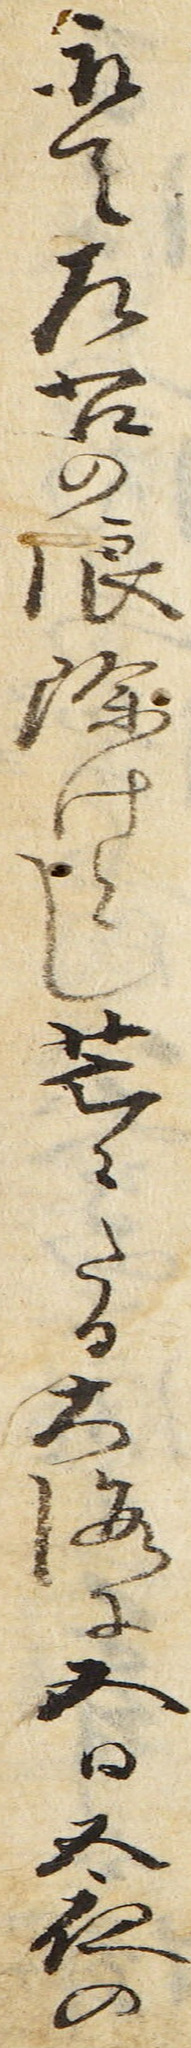取て左右の浪除けとし芒々たる大海に五日五夜の

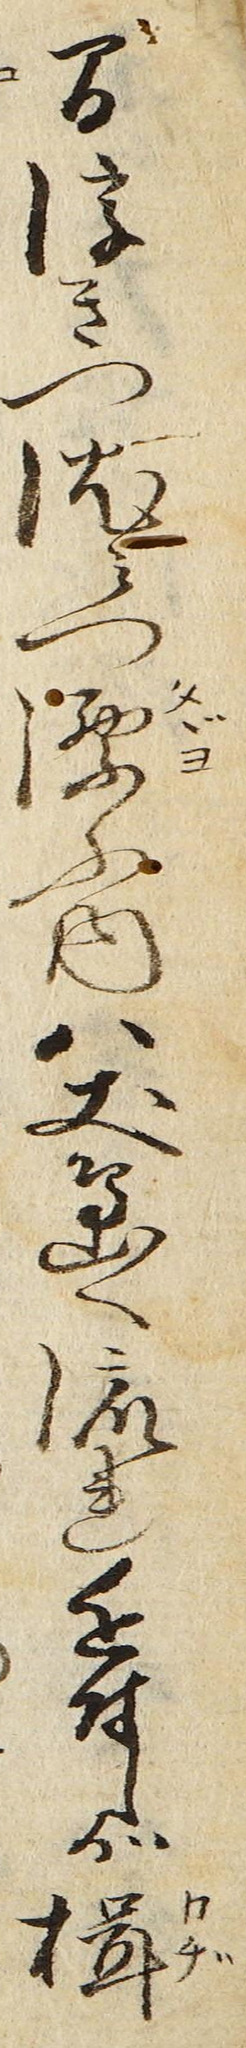間浮きつ沈ミつ漂ふ内八丈島へ流れ近付しが楫
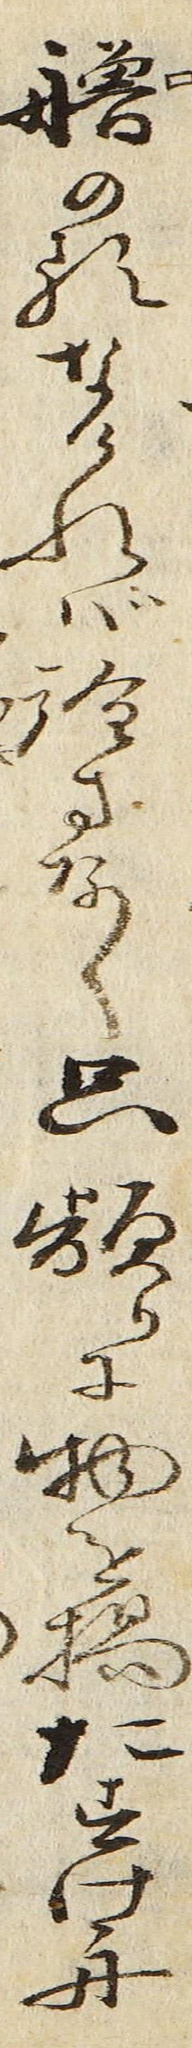艪の類なけれバ詮方なく只頻りに物を揚たすけ舟
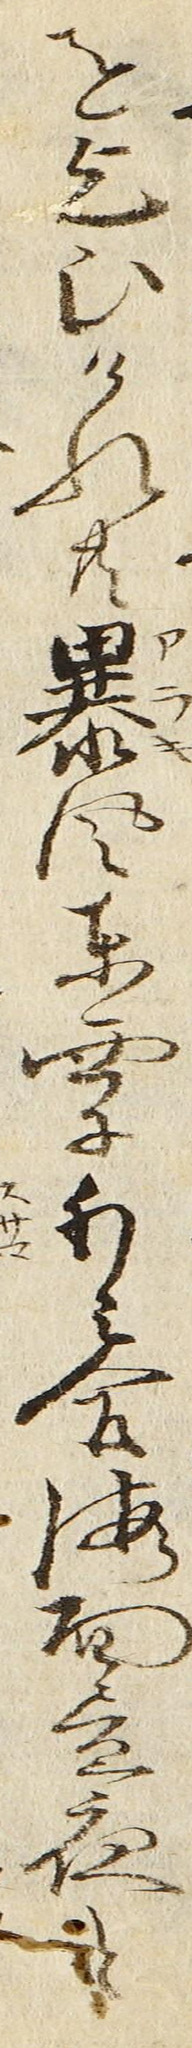を乞ひけれ共暴風東西にもみ合海面昼夜と
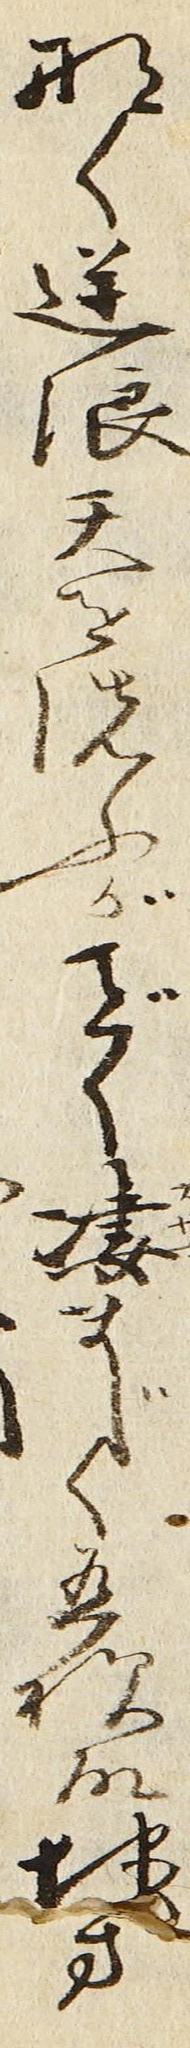なく送浪天を洗ふがごとく凄まじく有様故地方
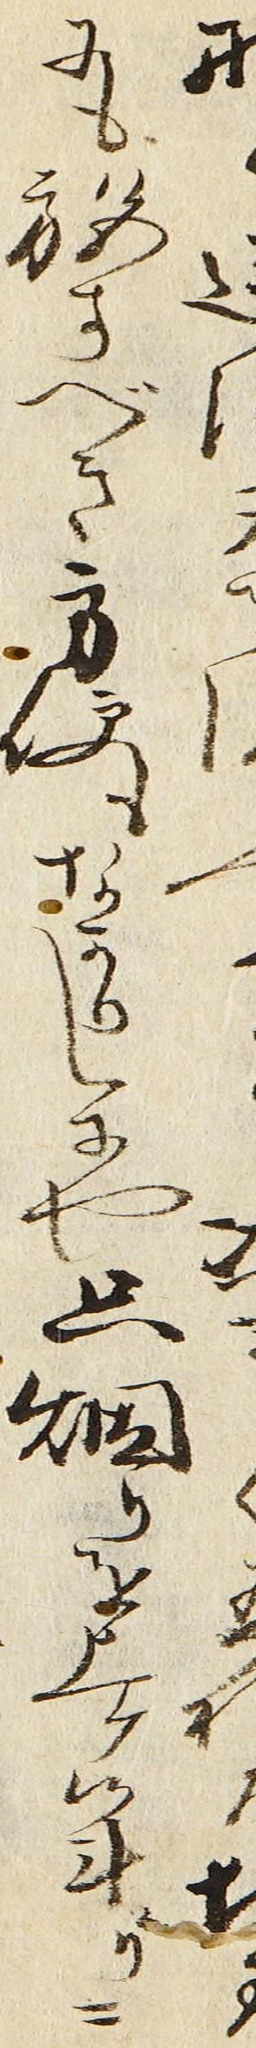にも施すべき方便もなかりしにや只烟りを上ケ候計りニ
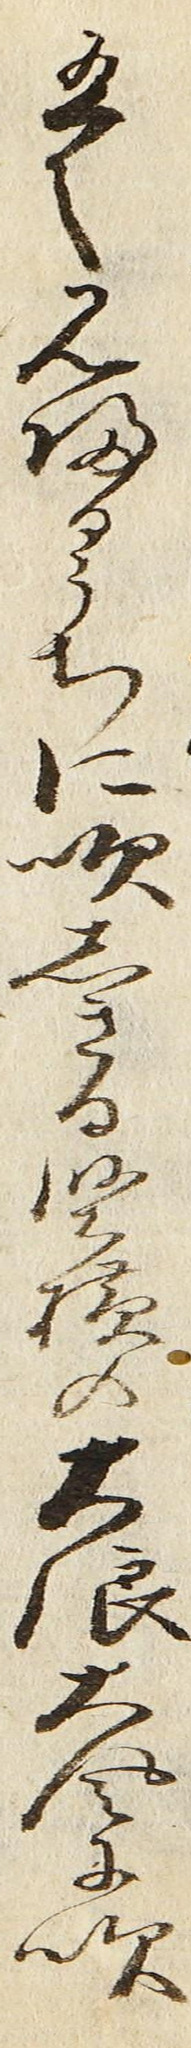有之見帰るうちに吹しきる竪横の大浪大風に吹
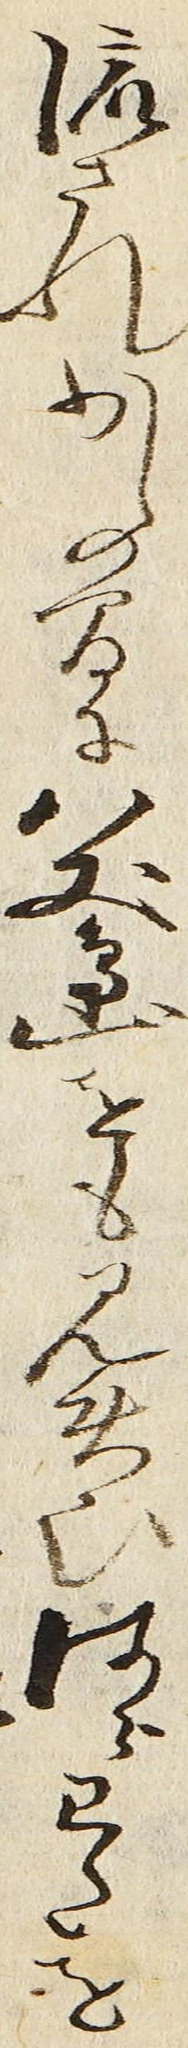流され少しの間に八丈島をも見失ひはらわたを
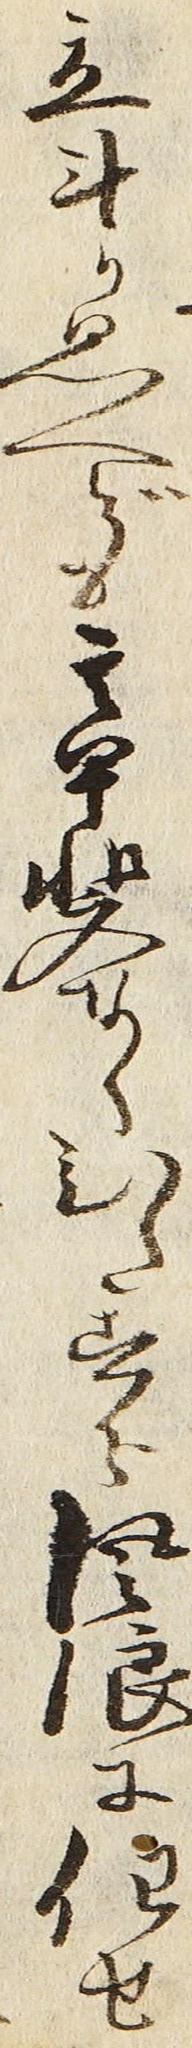立計り思へども其甲斐なくひたすら風浪に任せ
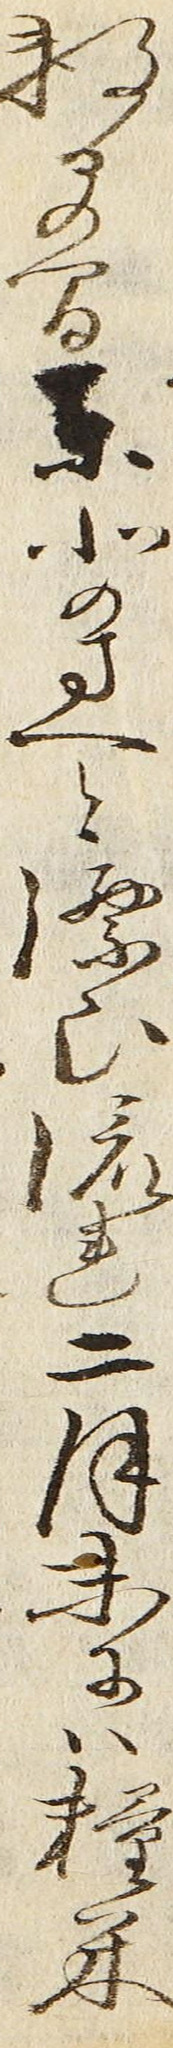数日の間東北の方へと漂ひ流れ二月末にハ糧米
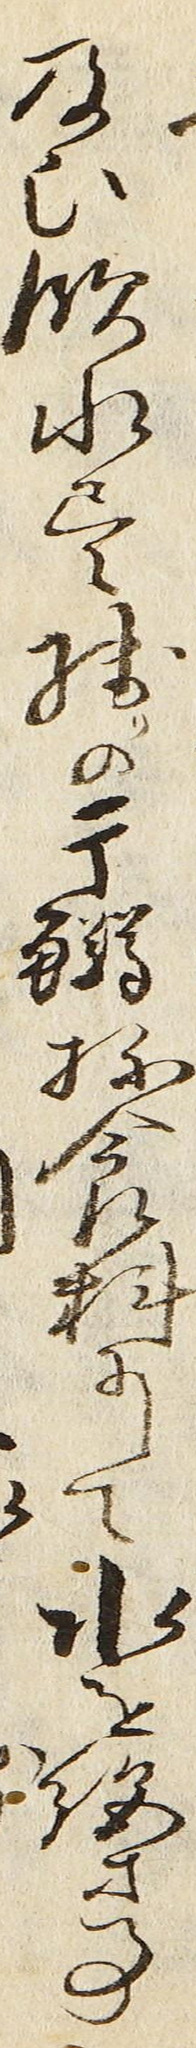及び飲水尽残りの干鰯抔食料にて水を絶す事
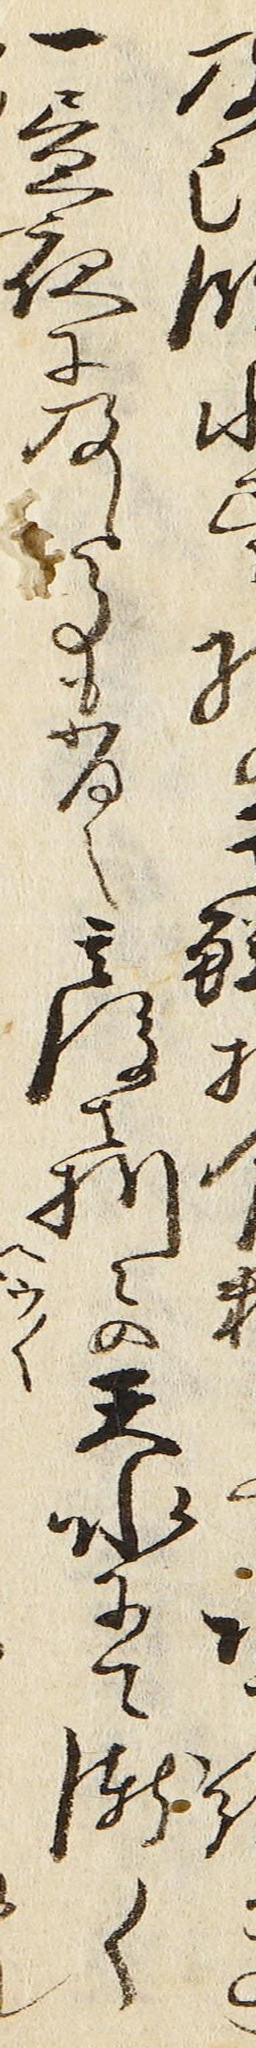一昼夜に及し事も有之其後者折々の天水にて漸く
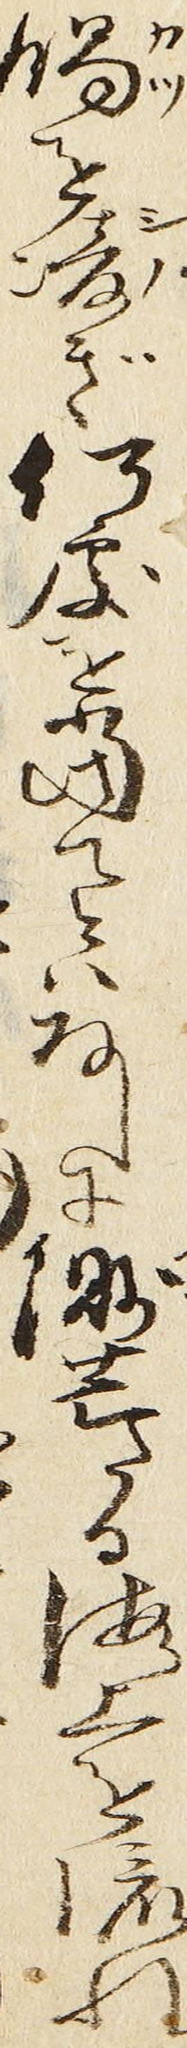餲を凌ぎ何処を当てとハなしに渺芒たる海上を流れ
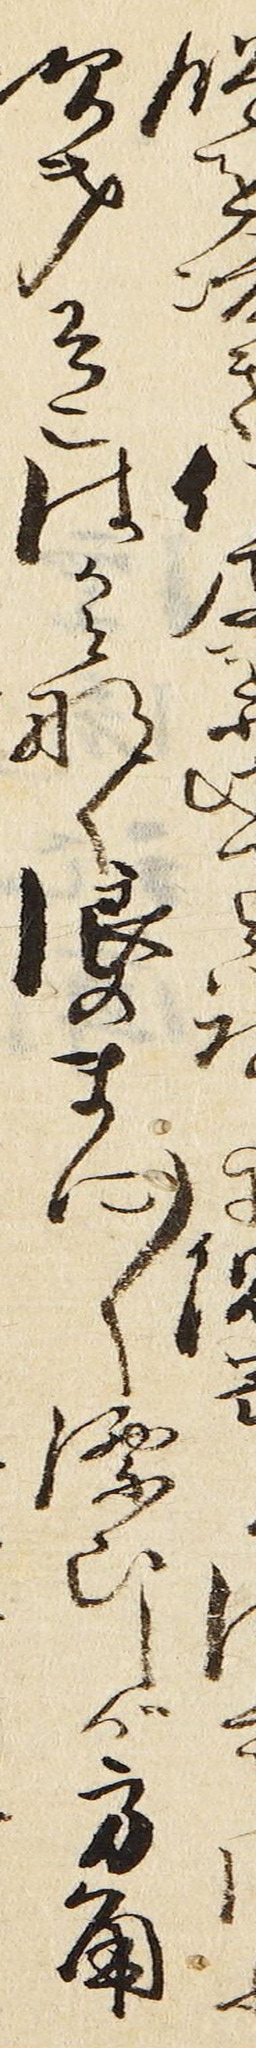次第そこはかとなく浪のまに〳〵漂ひしが方角
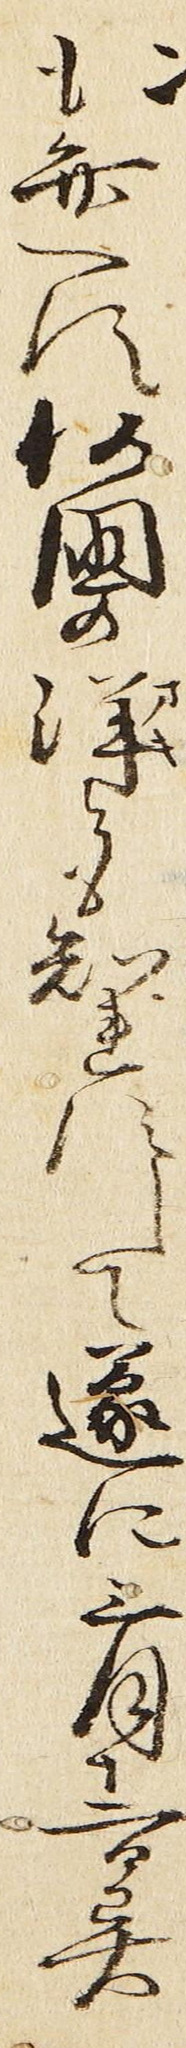も弁へす何国の洋とも知れすして遂に三月十二日異
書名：亜墨利加漂流記聞
